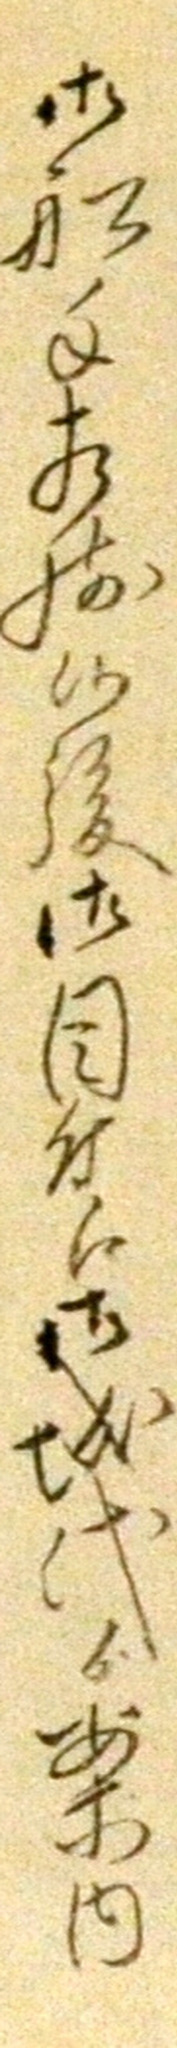御船手相揃候後御目付え御城代ゟ案内
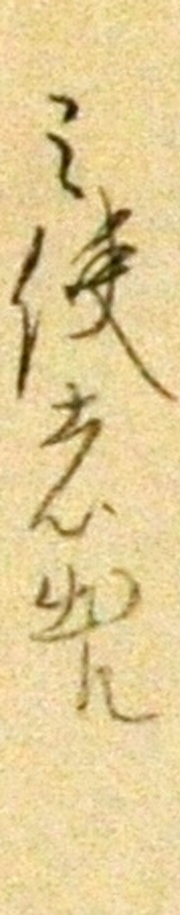之使者出ル
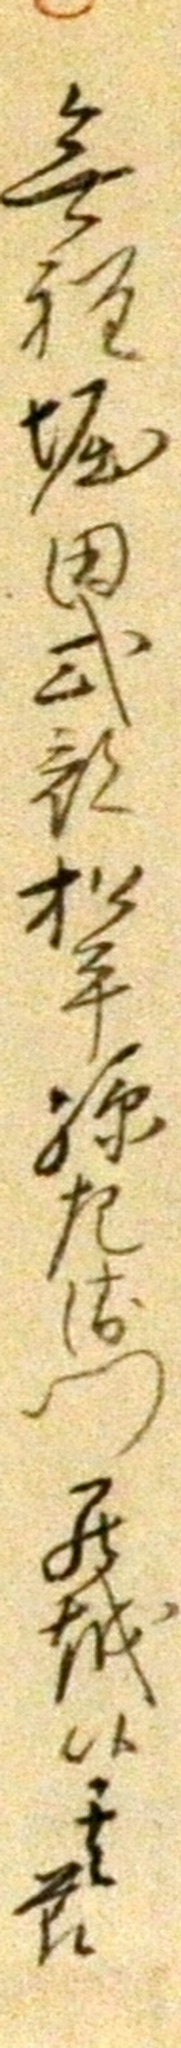無程堀田式部松平源左衛門罷越候其節
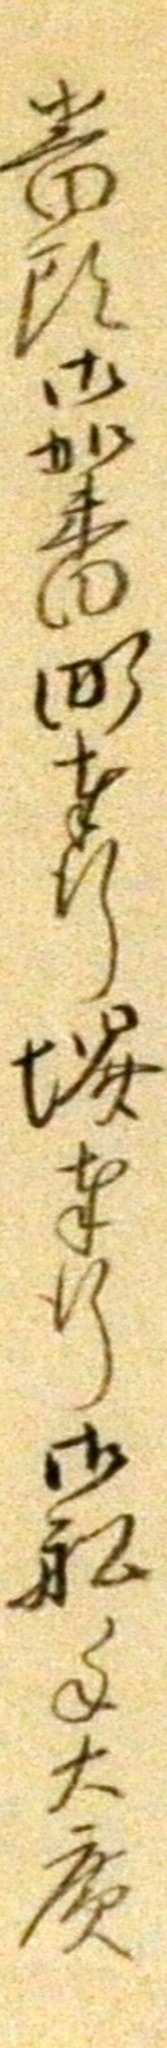番頭御加番町奉行堺奉行御船手大広
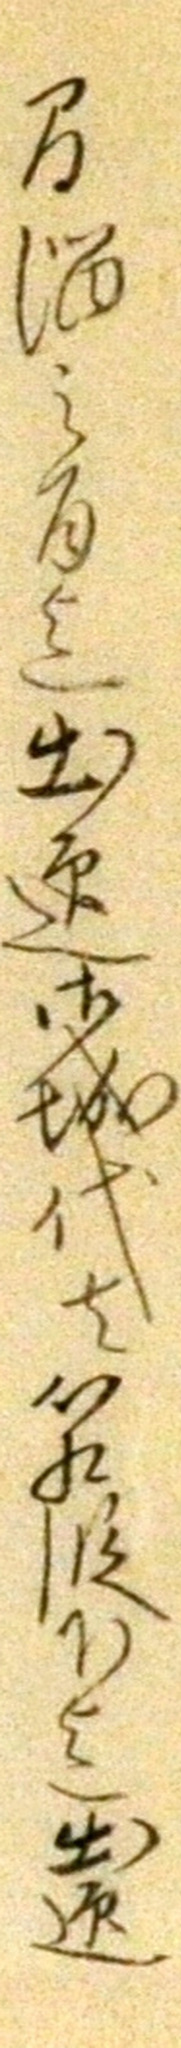間溜之間迄出迎御城代は箱段下迄出迎
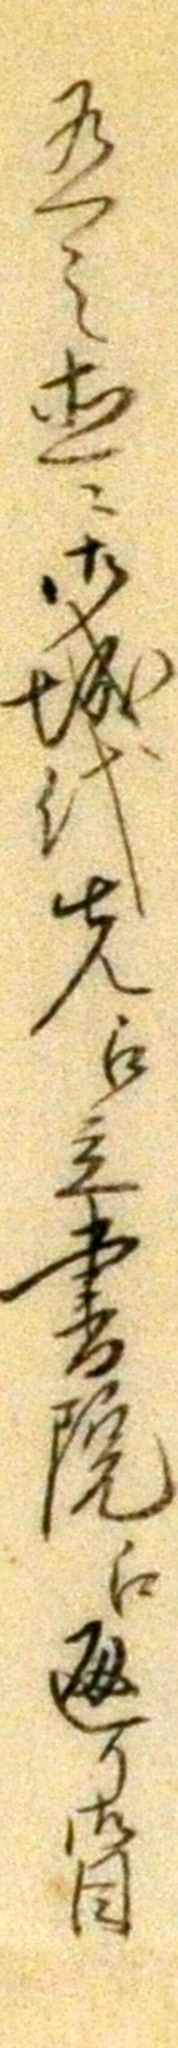有之直ニ御城代先え立書院え通り御目
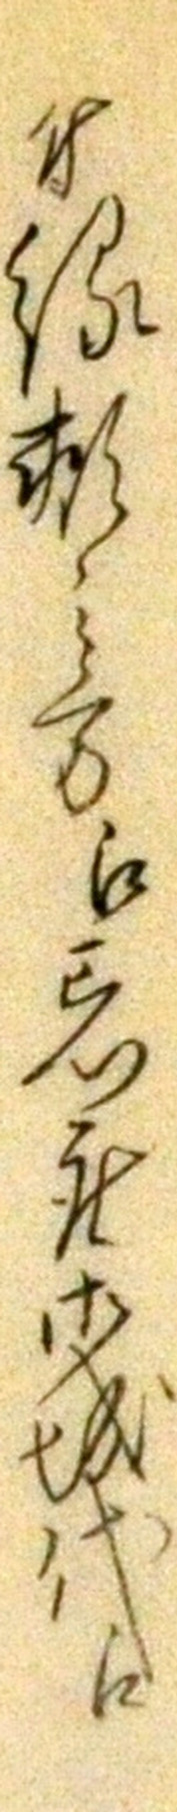付縁頬之方え着座御城代え
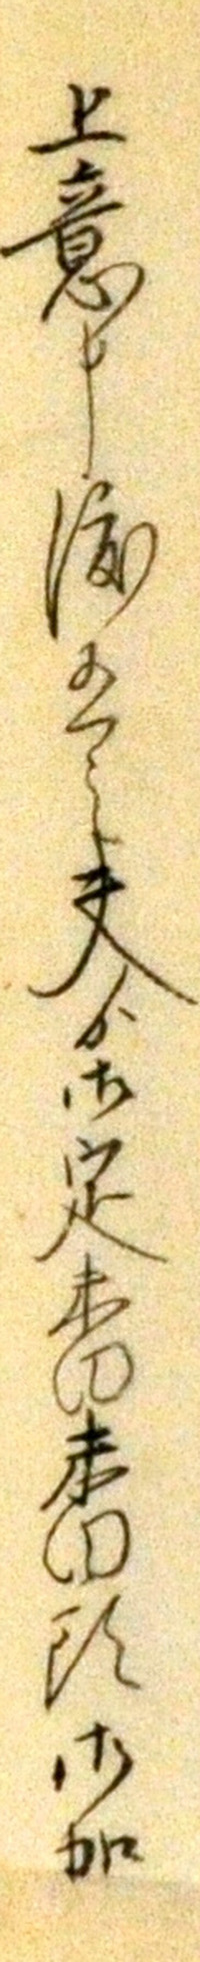上意申渡有之夫ゟ御定番番頭御加
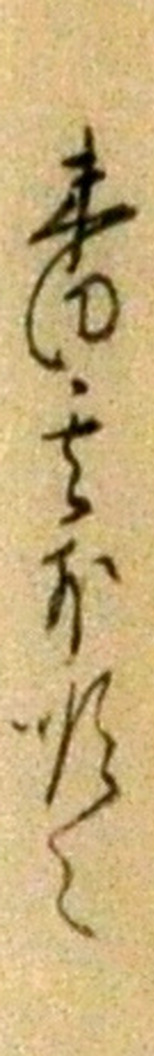番其外順々
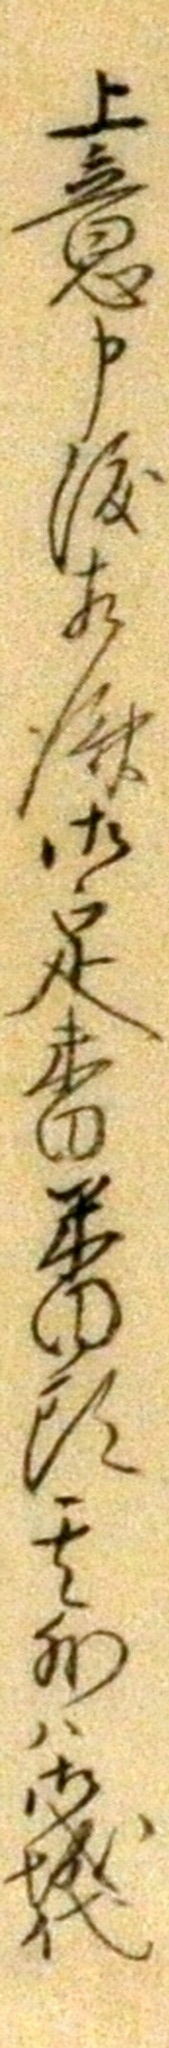上意申渡相済御定番番頭其外ハ御城代
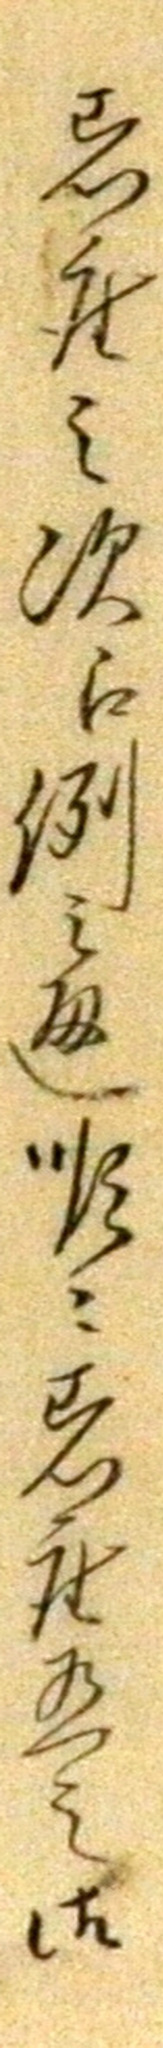着座之次え例之通順ニ着座有之御
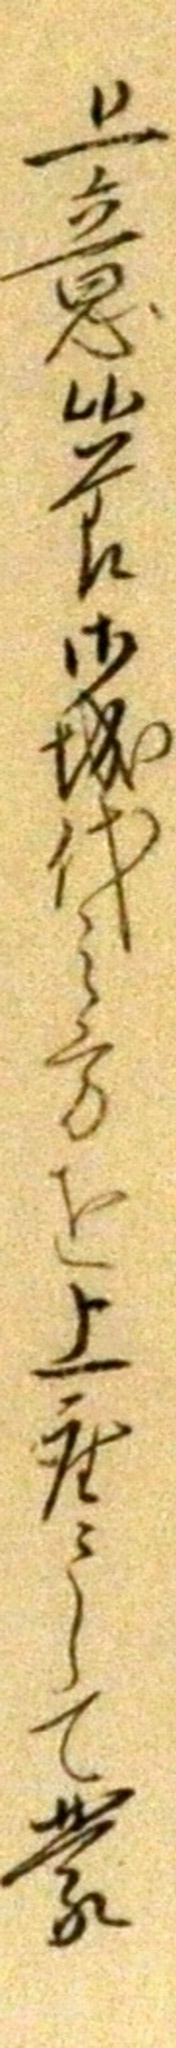上意候節御城代之方を上座ニして蒙
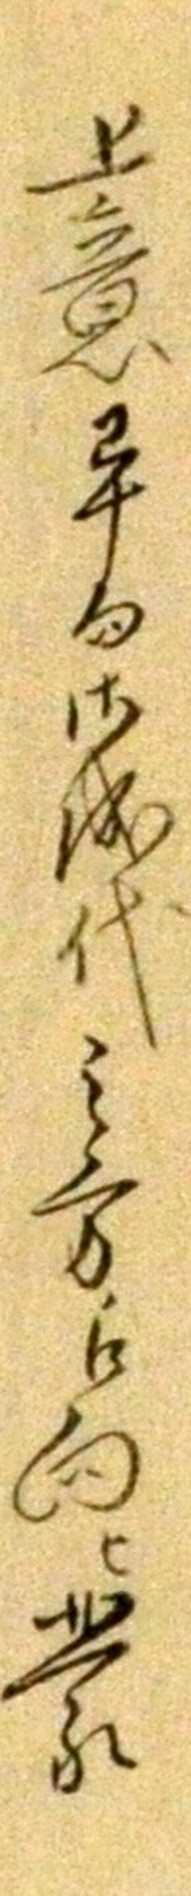上意畢而御城代之方え向ヒ蒙
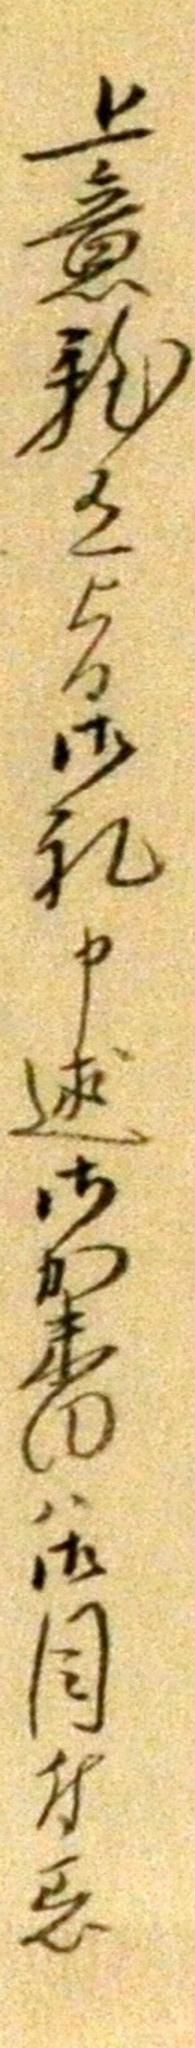上意難有旨御礼申述御加番ハ御目付着
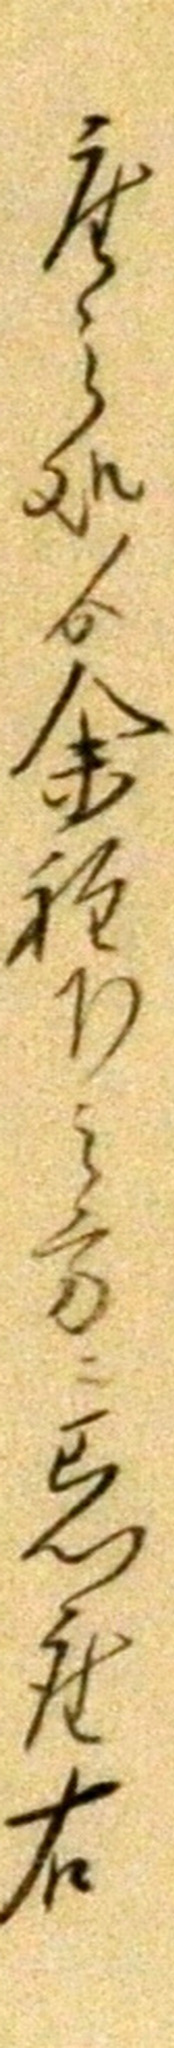座之処ゟ余程下之方ニ着座右
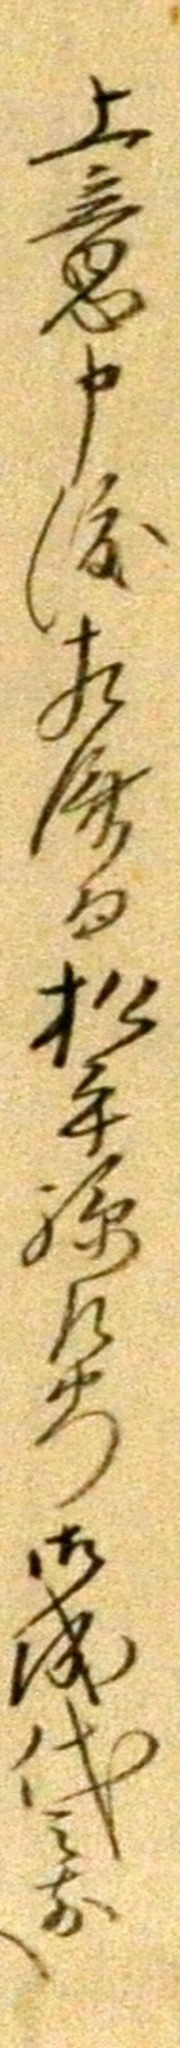上意申渡相済而松平源左衛門御城代之前へ
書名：大阪加番関係諸書留〔一括〕
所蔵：伊那市立高遠町図書館・合同会社AMANE
